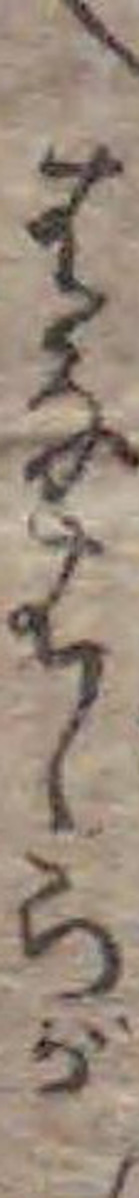はなはしらが
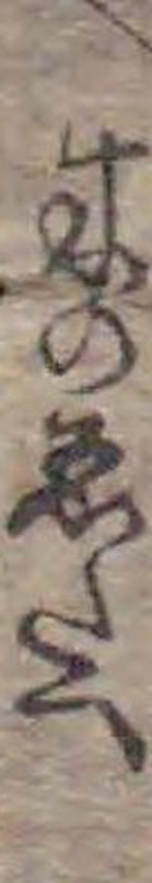木のゑたへ
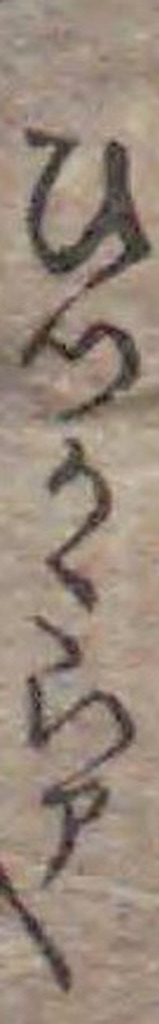ひつかゝらァ
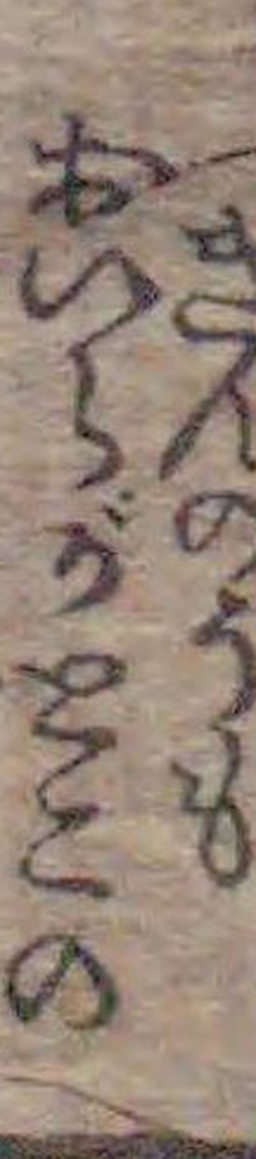おいらがとこの
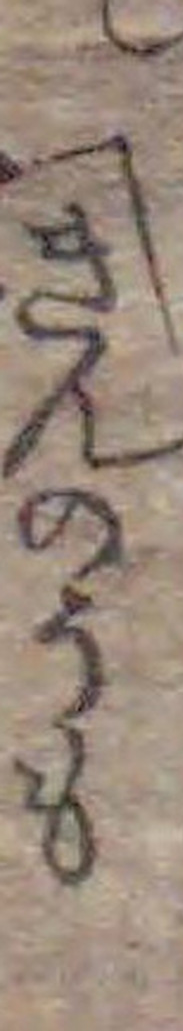〽きんのうも
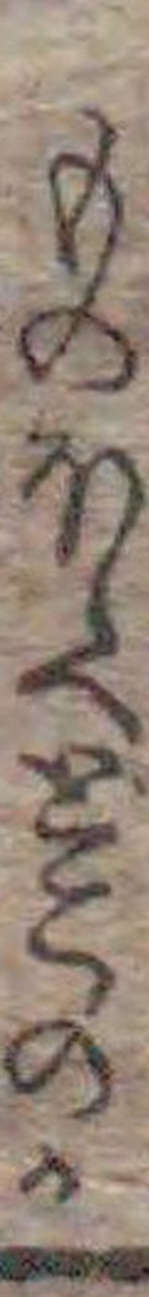ものほしへどこのか
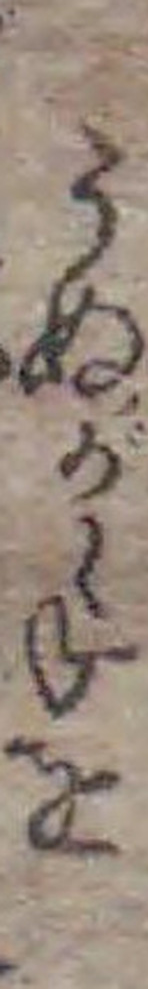うぬが手を
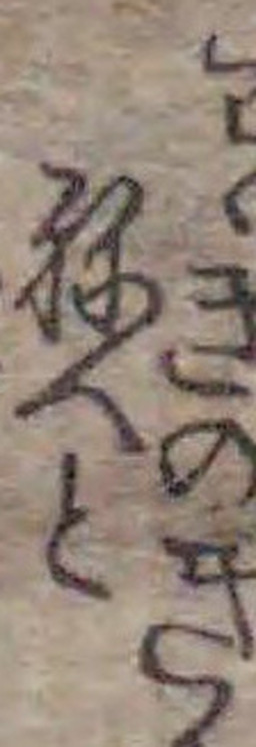ねへと
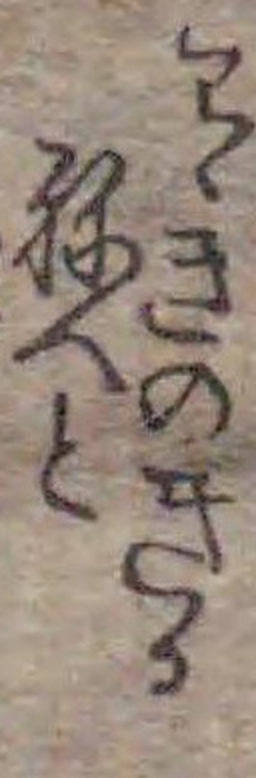ねへと
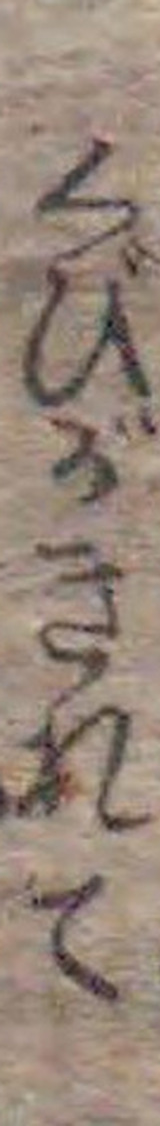くびがきれて
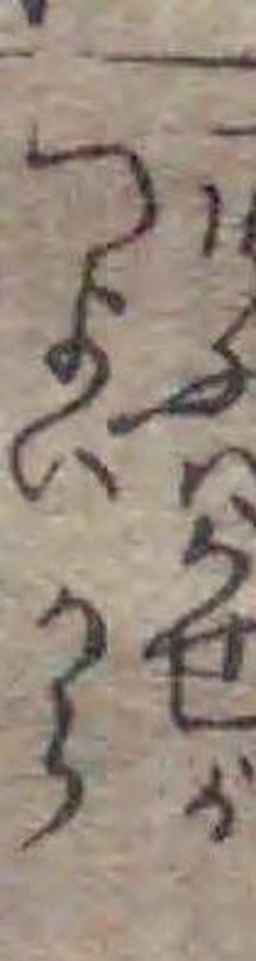つよいから
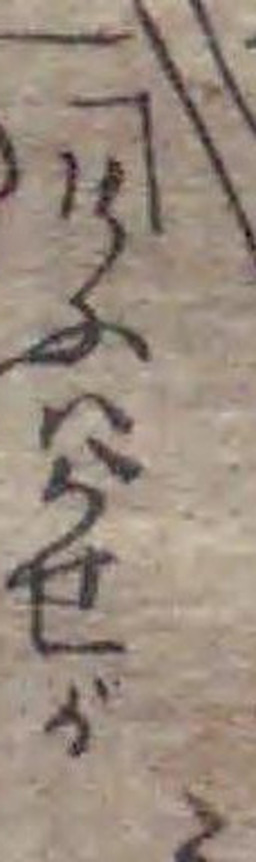〽けふはかせか
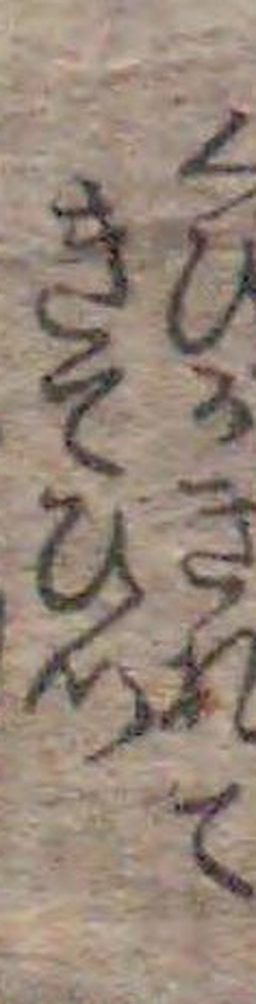きてひつ
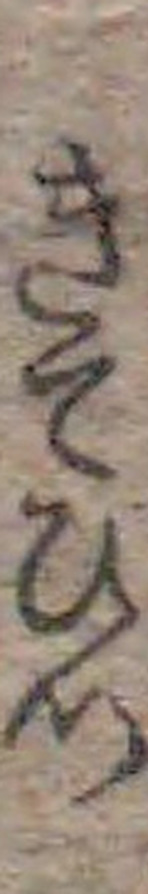きてひつ
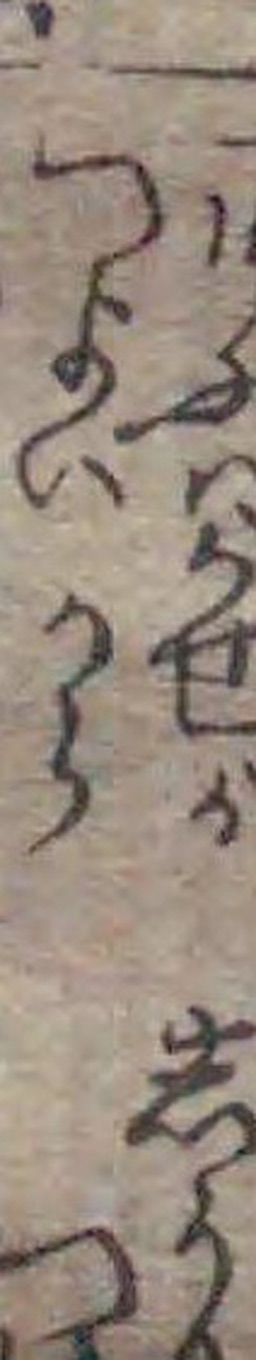つよいから
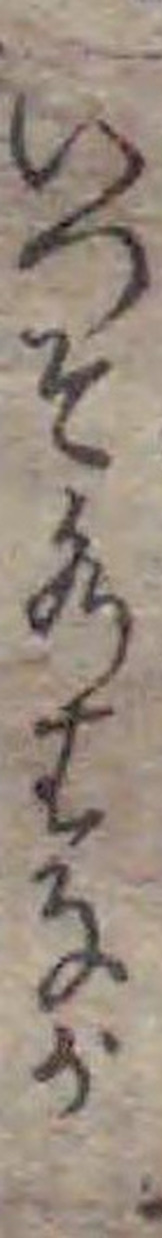いつそ水はなか
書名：年中行状記 : 2巻
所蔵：国立国会図書館 National Diet Library, JAPAN
